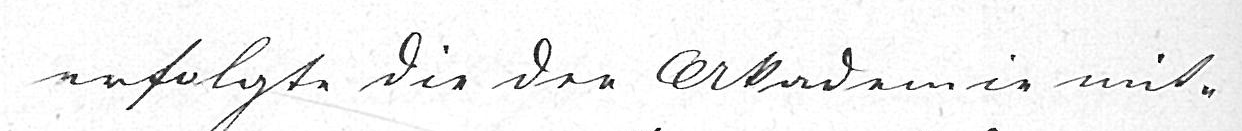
erfolgte die der Akademie mit-
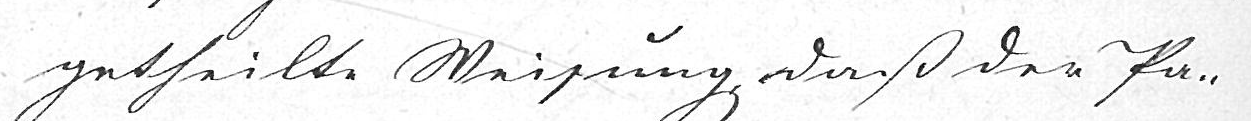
getheilte Weisung, daß der Pa-
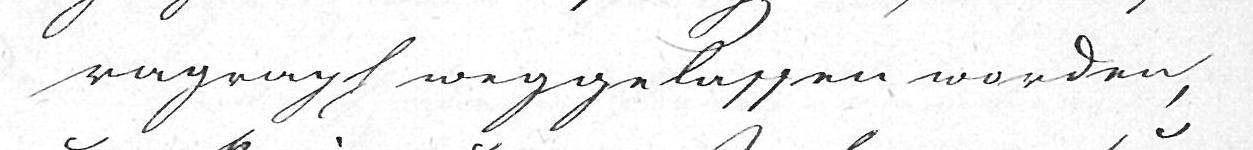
ragraph weggelassen worden,
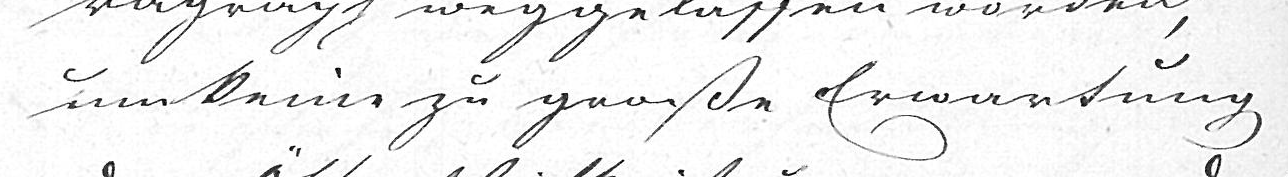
um keine zu große Erwartung
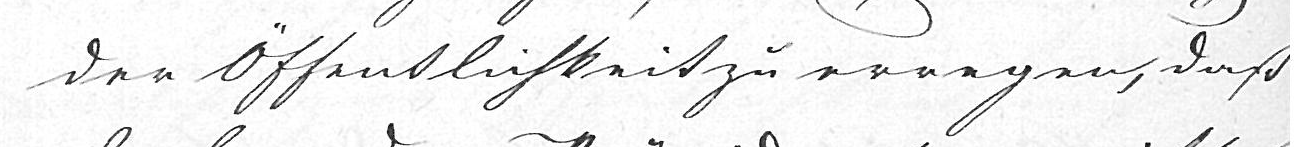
der Öffentlichkeit zu erregen, daß
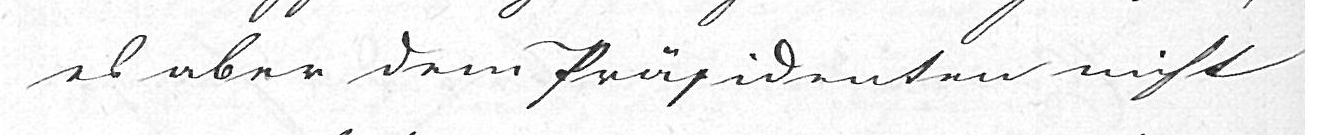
es aber dem Präsidenten nicht
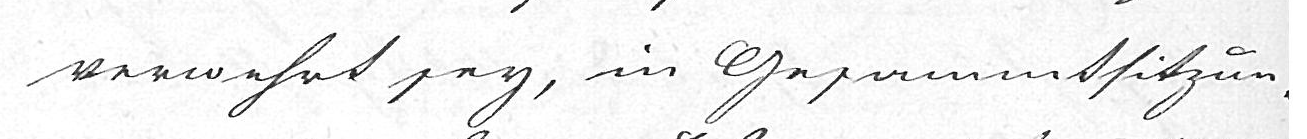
verwehrt sey, in Gesammtsitzun-
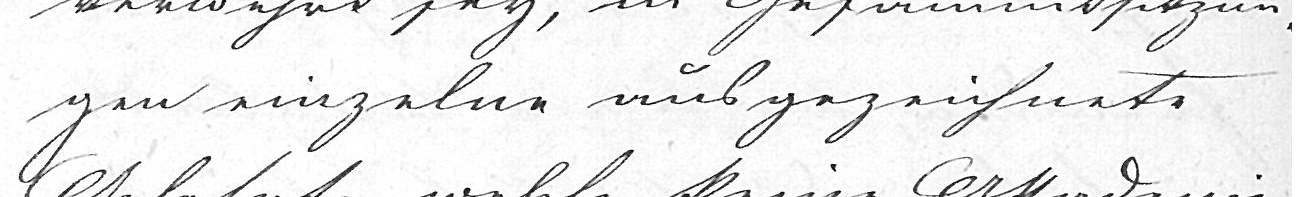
gen einzelne ausgezeichnete
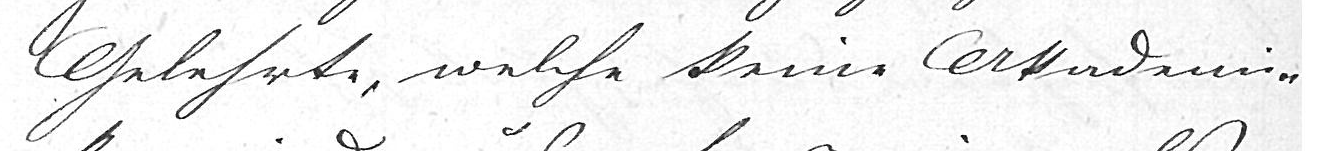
Gelehrte, welche keine Akademi-
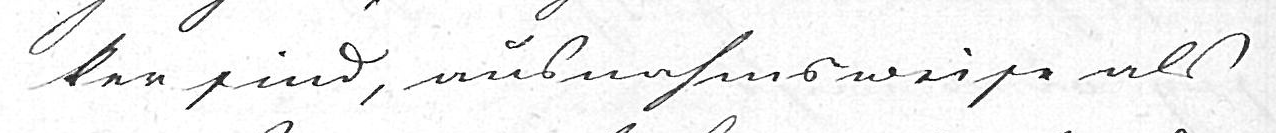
ker sind, ausnahmsweise als
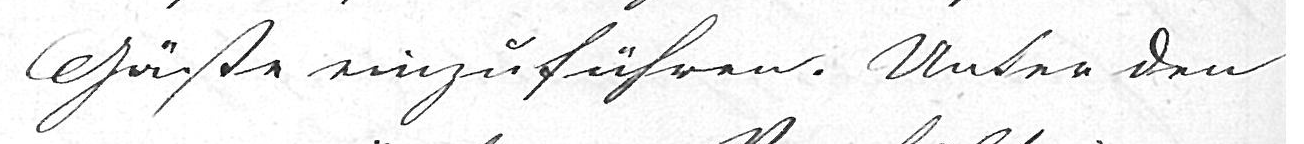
Gäste einzuführen. Unter den
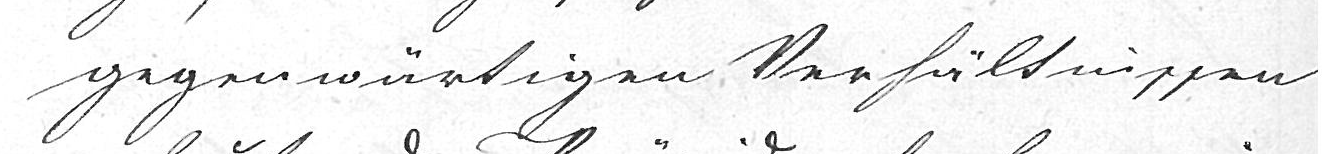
gegenwärtigen Verhältnissen
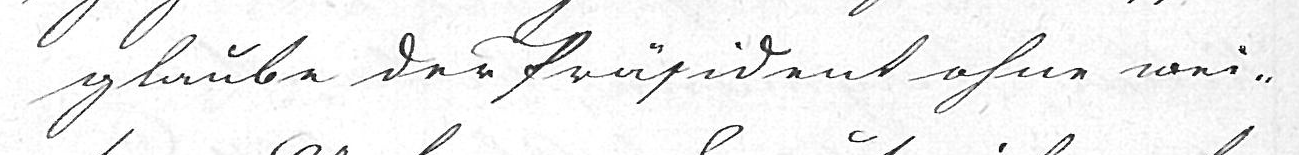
glaube der Präsident ohne wei-
